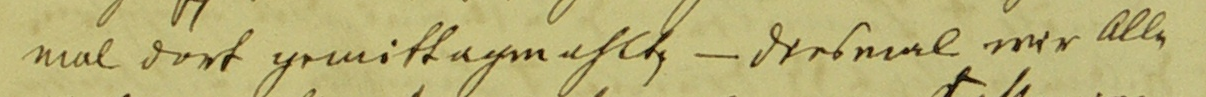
Mal dort gemittagmahlt - Diesmal wir alle
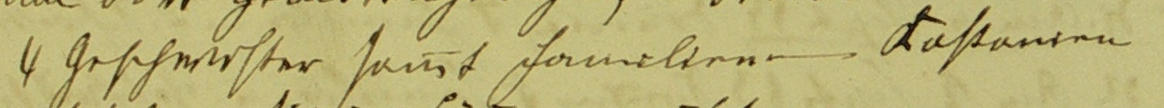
4 Geschwister samt Familien - Kastanien
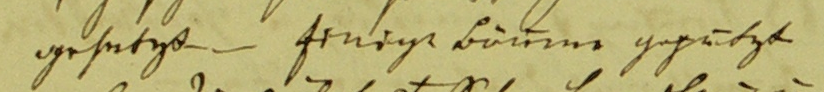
gesucht - Einige Bäume geputzt.
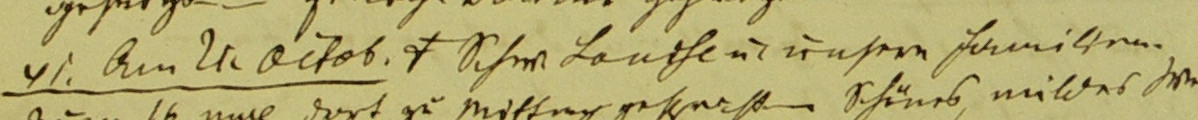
41) Am 25. Oktob. Mit Schwester Louise und unseren Familien
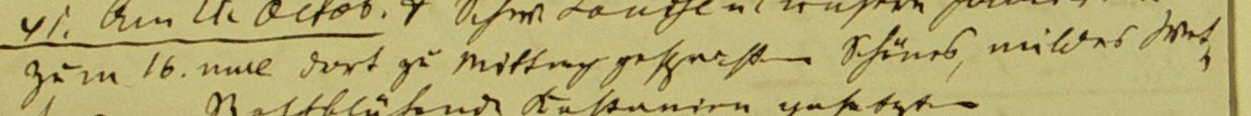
zum 16. mal dort Mittag gespeist,- Schönes mildes Wet¬
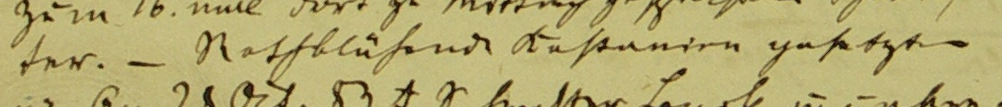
ter. - Rotblühende Kastanien gesetzt. -
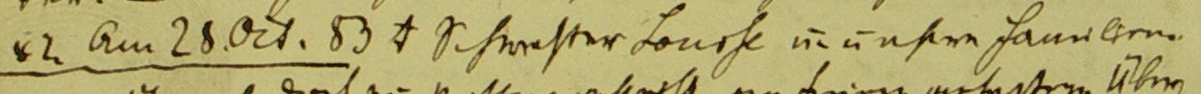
42) Am 28. Oktob. 83 mit Schwester Louise und unseren Familien
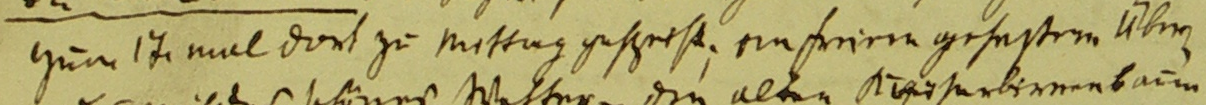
zum 17. mal dort zu Mittag gespeist; im Freien geseßen.
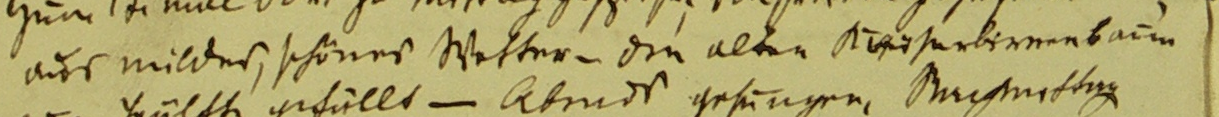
Überaus milde, schönes Wetter - den alten Kaiserbirnenbaum
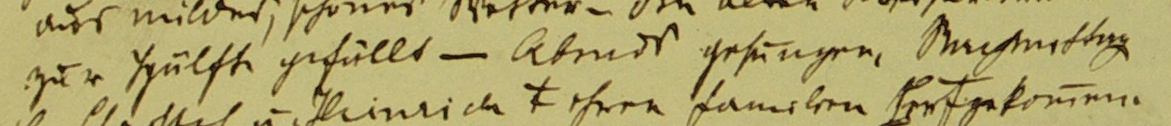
zur Hälfte gefällt - Abends gesungen, Nachmittag –
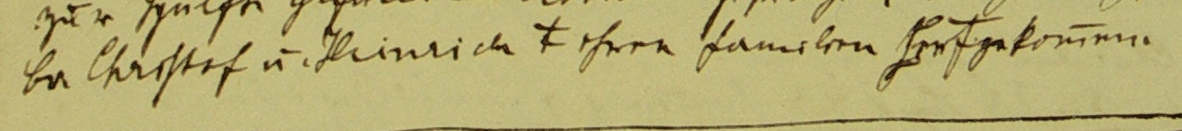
bei Christof und Heinrich mit ihren Familien zusammengekommen.
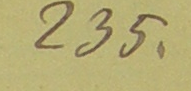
235
